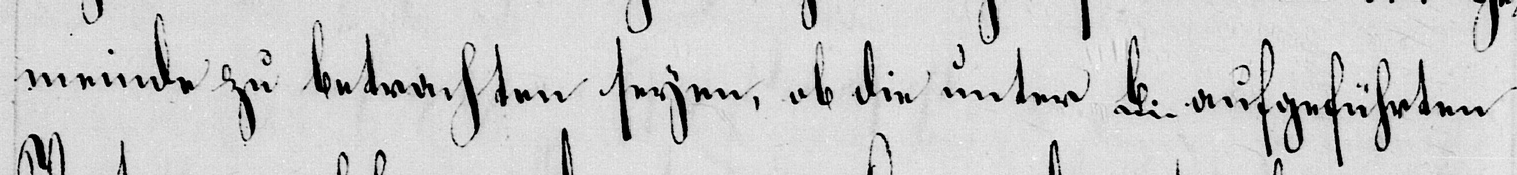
meinde zu betrachten seyen, ob die unter b. aufgeführten
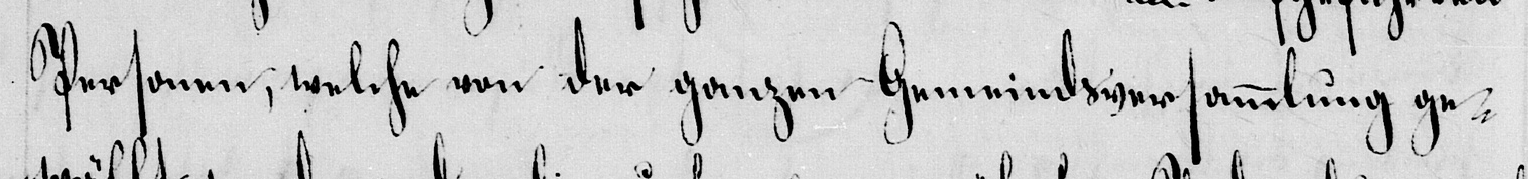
Personen, welche von der ganzen Gemeindsversammlung ge¬
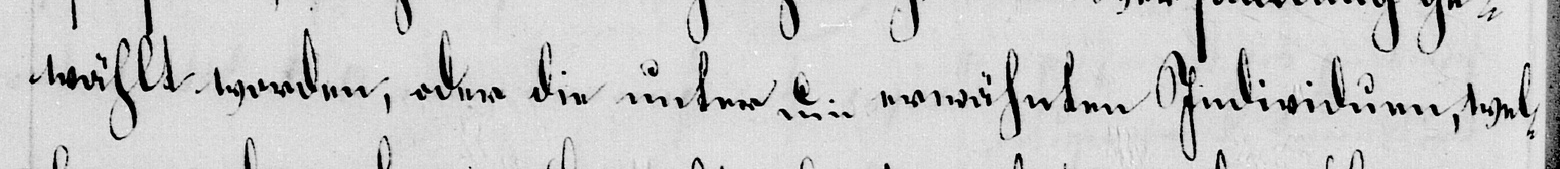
wählt worden, oder die unter c. erwähnten Individuen, wel¬
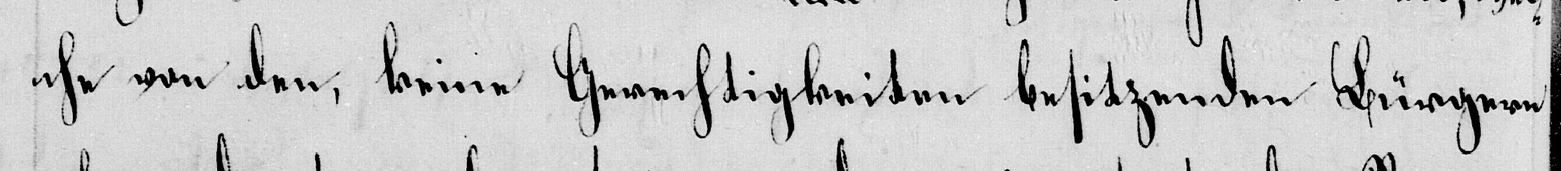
che von den, keine Gerechtigkeiten besitzenden Bürgern
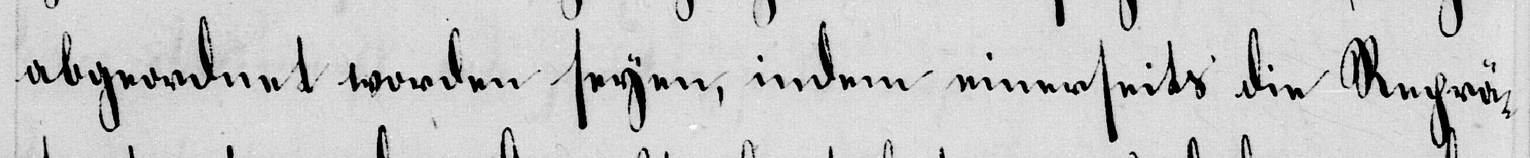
abgeordnet worden seyen, indem einerseits die Reprä¬
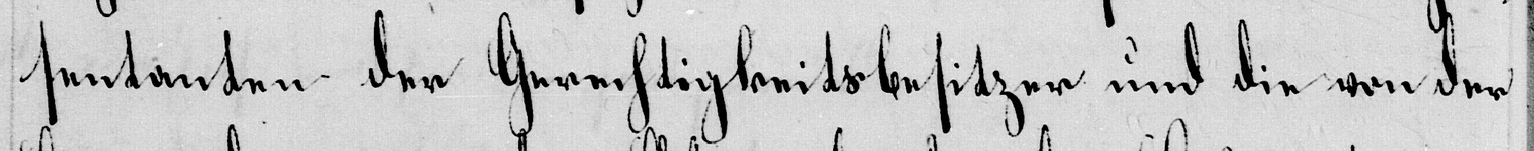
sentanten der Gerechtigkeitsbesitzer und die von der
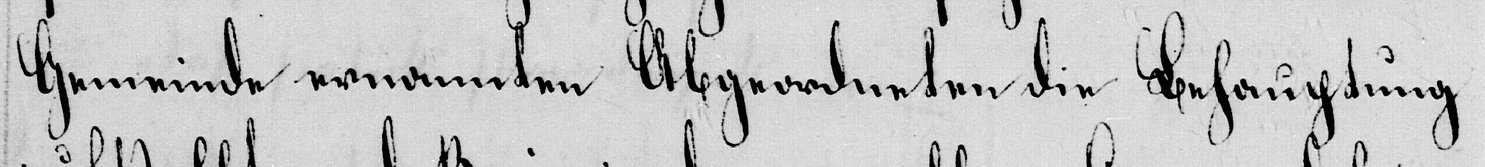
Gemeinde ernannten Abgeordneten die Behauptung
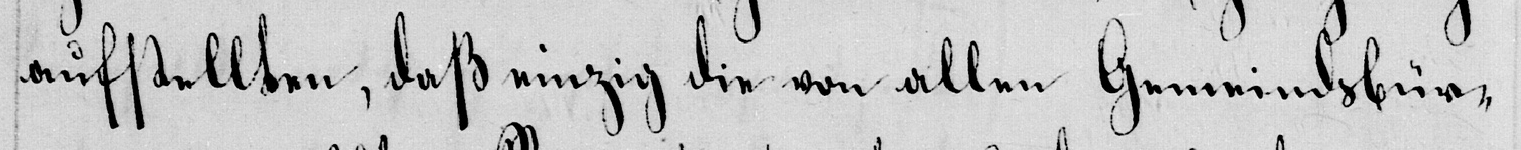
aufstellten, daß einzig die von allen Gemeindsbür¬
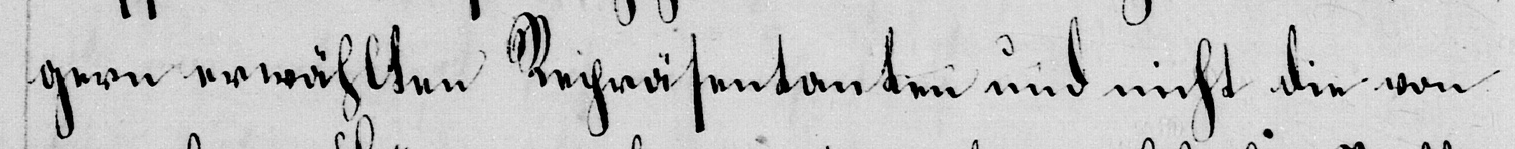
gern erwählten Repräsentanten und nicht die von
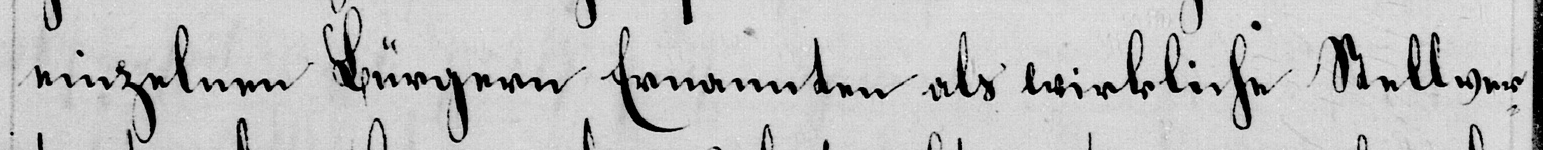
einzelnen Bürgern Ernannten als wirkliche Stellver¬
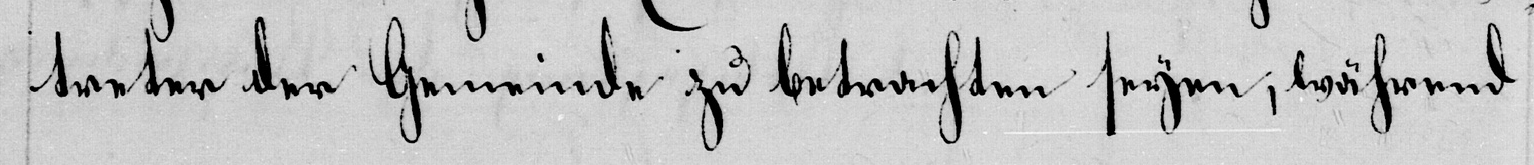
treter der Gemeinde zu betrachten seyen, während
